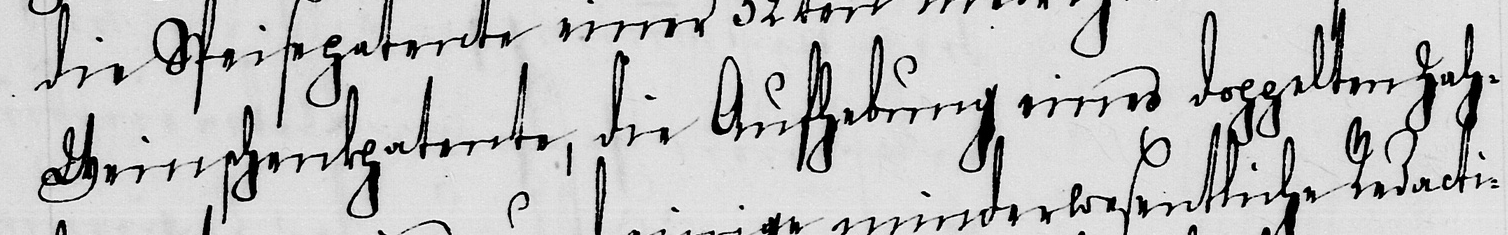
Weinschenkpatente, die Aufhebung eines doppelten Za¬
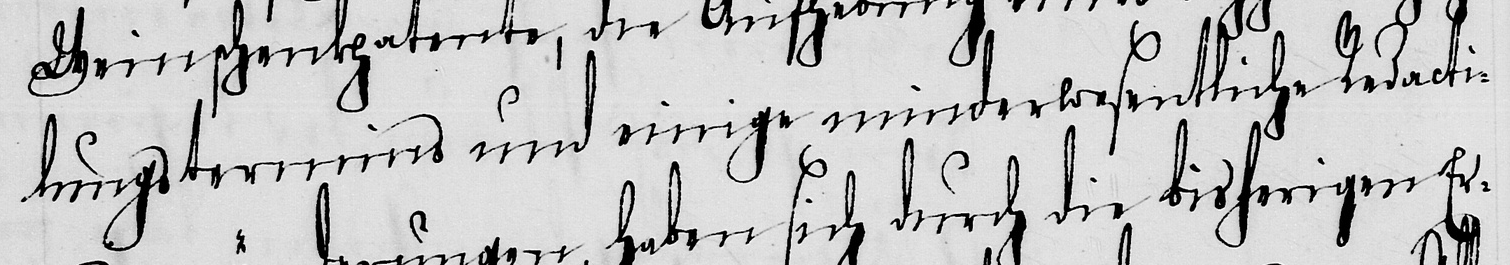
hlungstermins und einige minderwesentliche Redacti¬
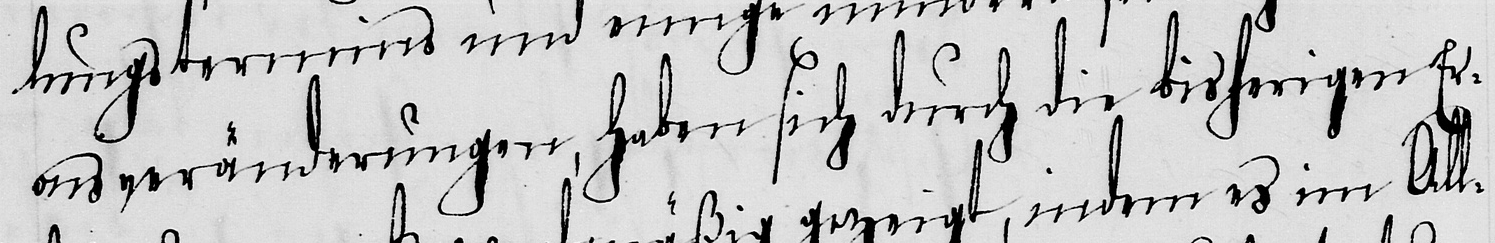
onsveränderungen, haben sich durch die bisherigen Er¬
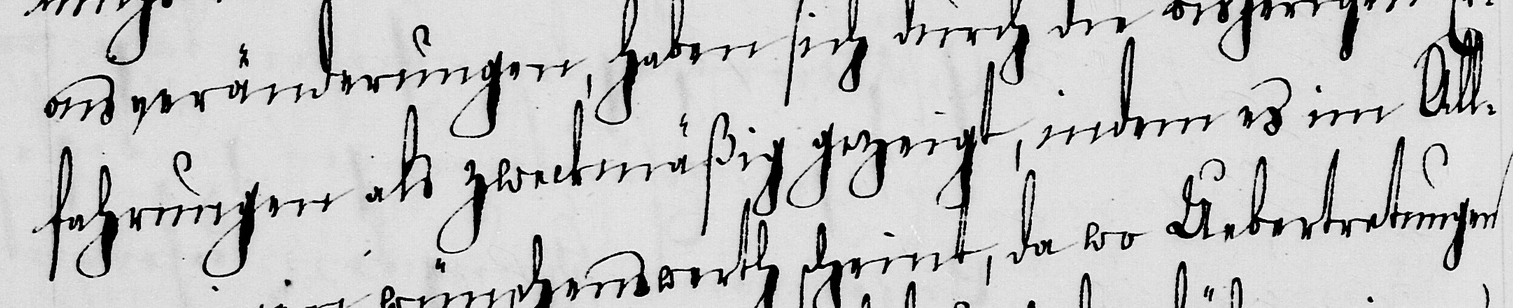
fahrungen als zweckmäßig gezeigt, indem es im All¬
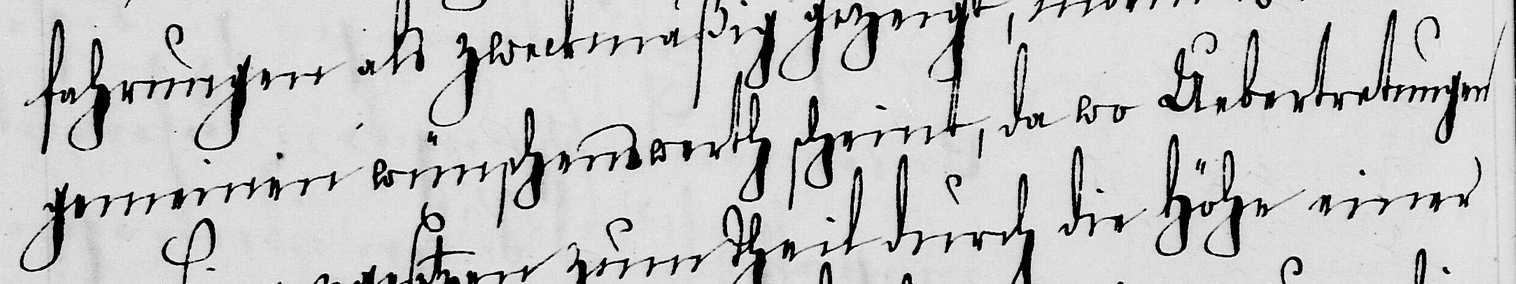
gemeinen wünschenswerth scheint, da wo Uebertretungen
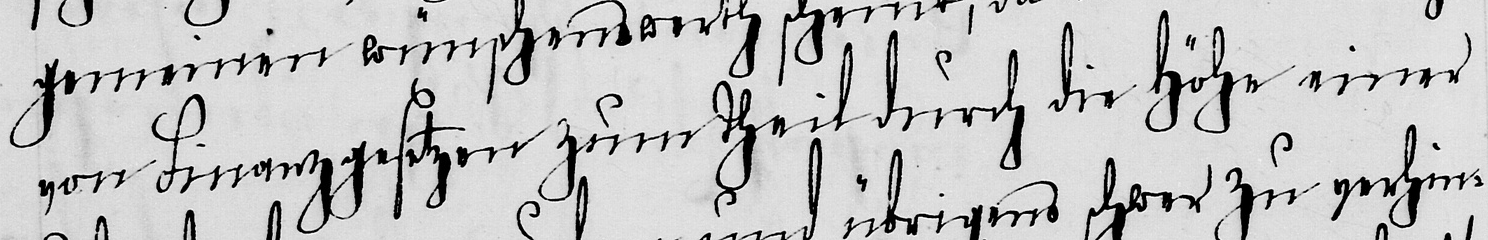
von Finanzgesetzen zum Theil durch die Höhe einer
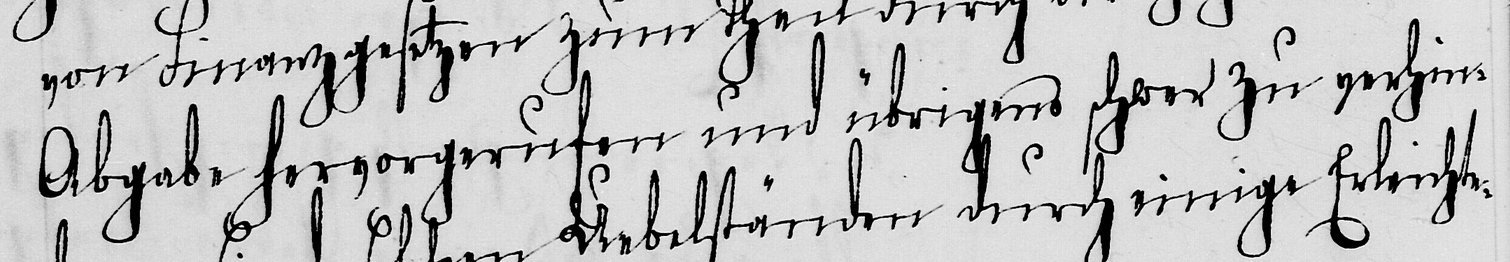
Abgabe hervorgerufen und übrigens schwer zu verhin¬
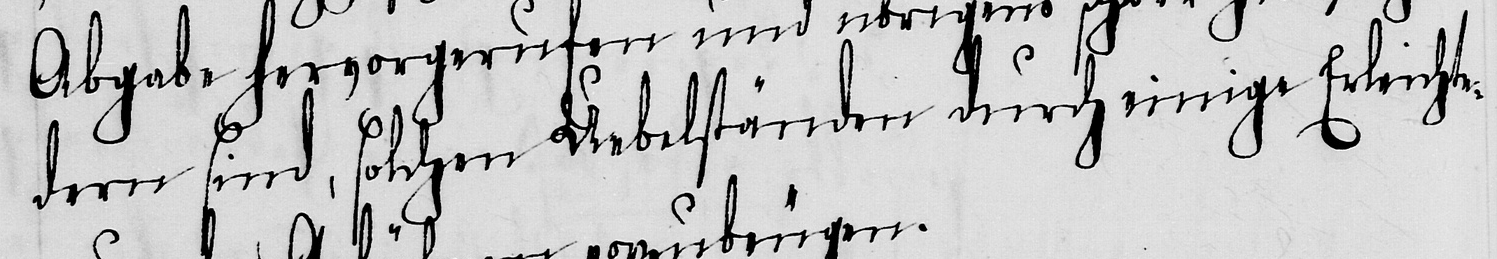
dern sind, solchen Uebelständen durch einige Erleicht¬
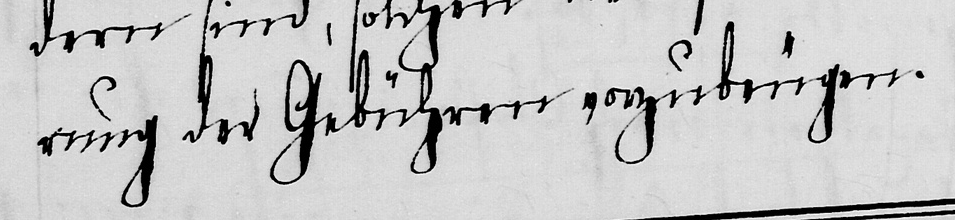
erung der Gebühren vorzubeugen.
